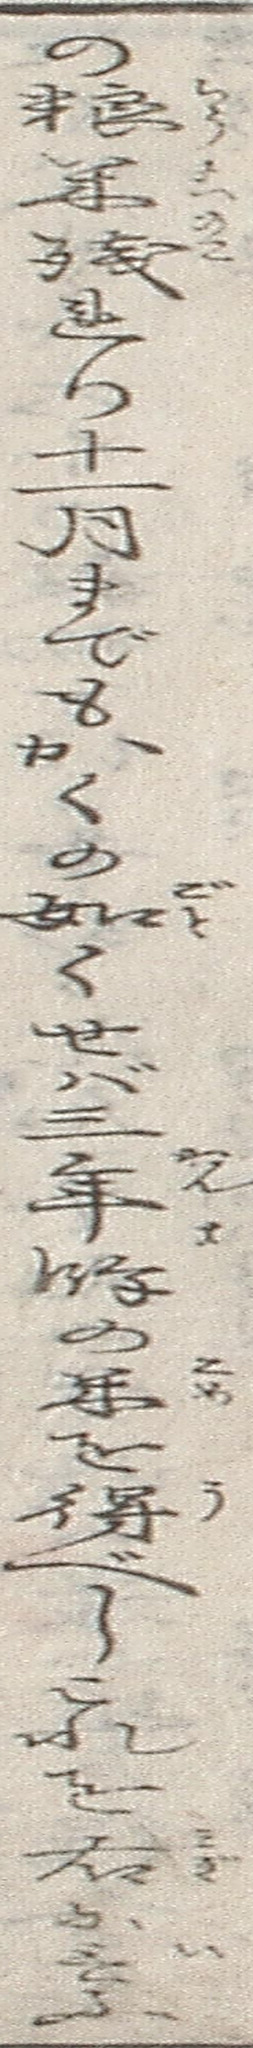の粮米残れり十一月までもかくの如くせば三年余の米を得べしこれを右に言ふ
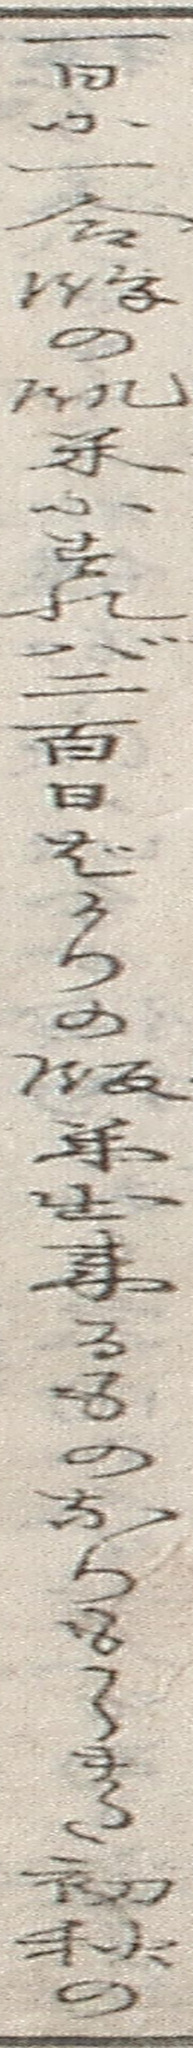一日に一合余の飢米にすれば二百日ばかりの飯米出来るものなりもしまた初秋の

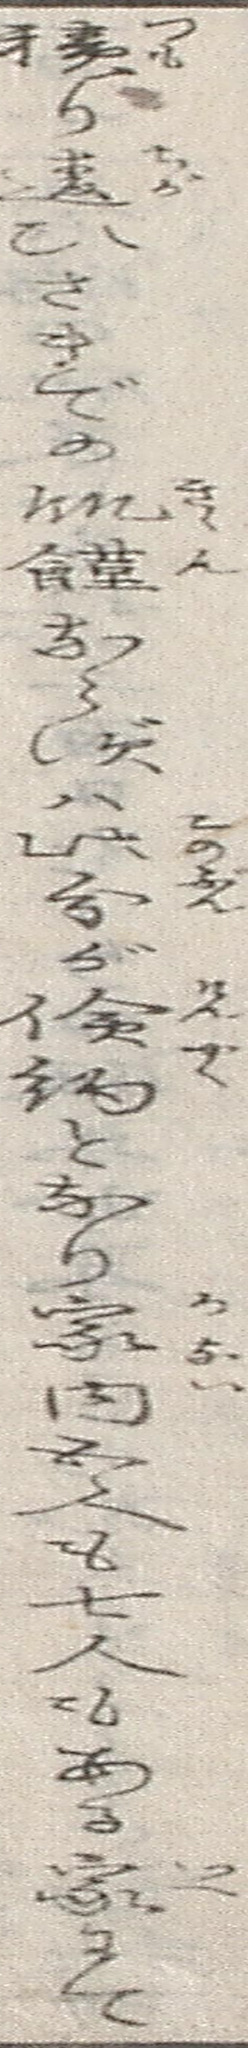積り違ひさまでの飢饉ならずは此分が倹約となり家内五人も七人もある家にて
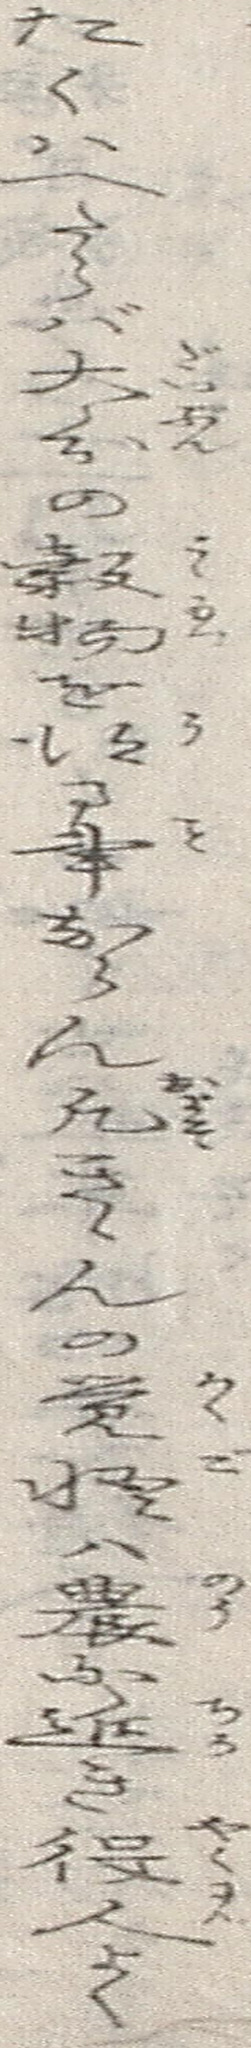たくはへたらば大分の穀物を得る事ならん凡きゝんの覚悟は農に近き役人よく
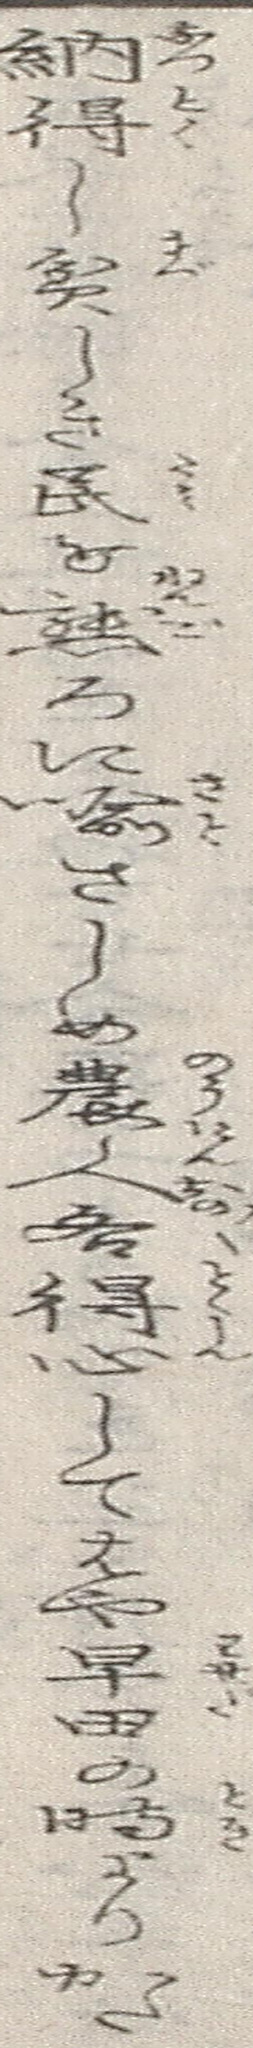納得し貧しき民を懇ろに諭さしめ農人各得心してはや早田の時よりかた
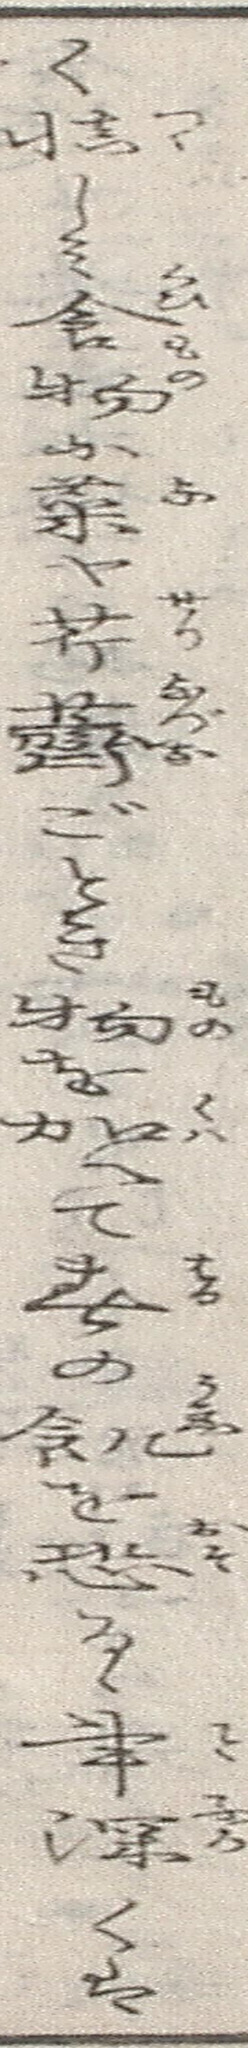く慎しみ食物に菜ヤ芹薺ごとき物を加へて春の飢を恐るゝ事深くは
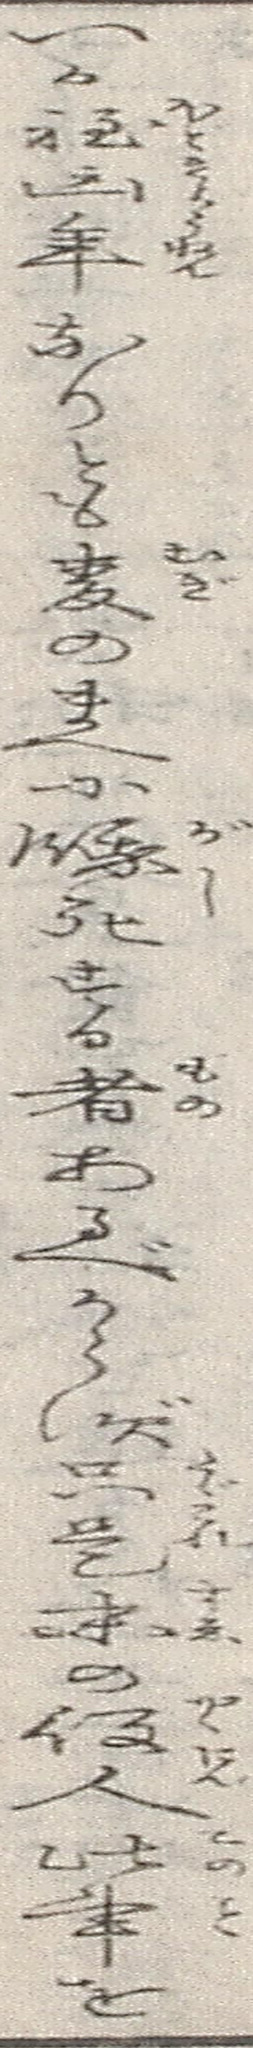いる程凶年なりとも麦のまへに餓死する者あるべからず只是末の役人此事を
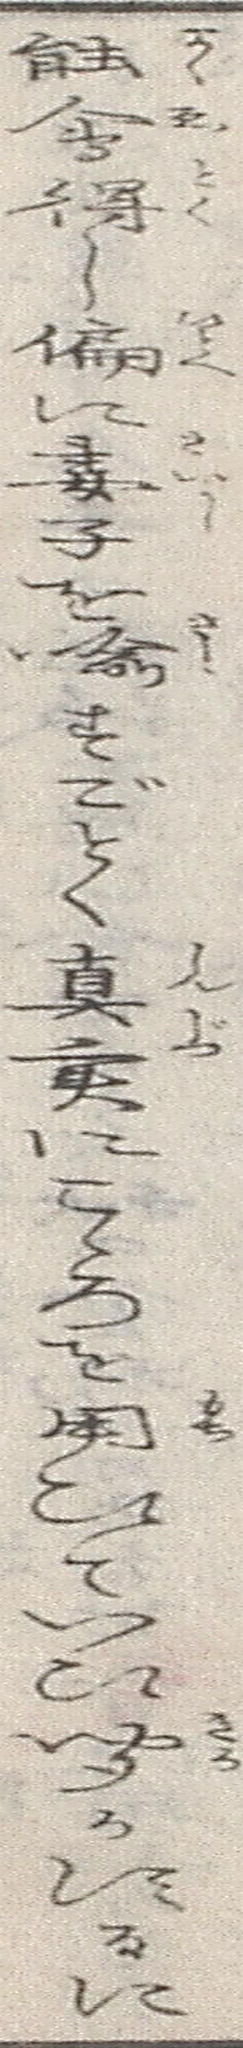能会得し偏に妻子を諭すごとく真実にこゝろを用ひていひ聞かするに
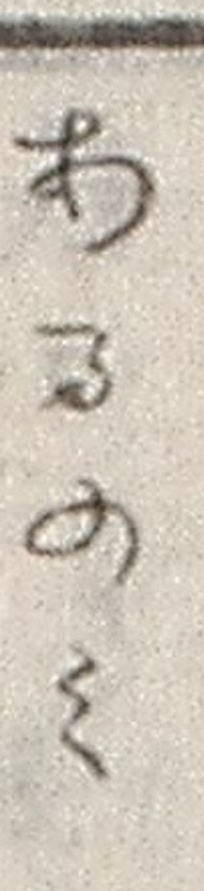あるのみ
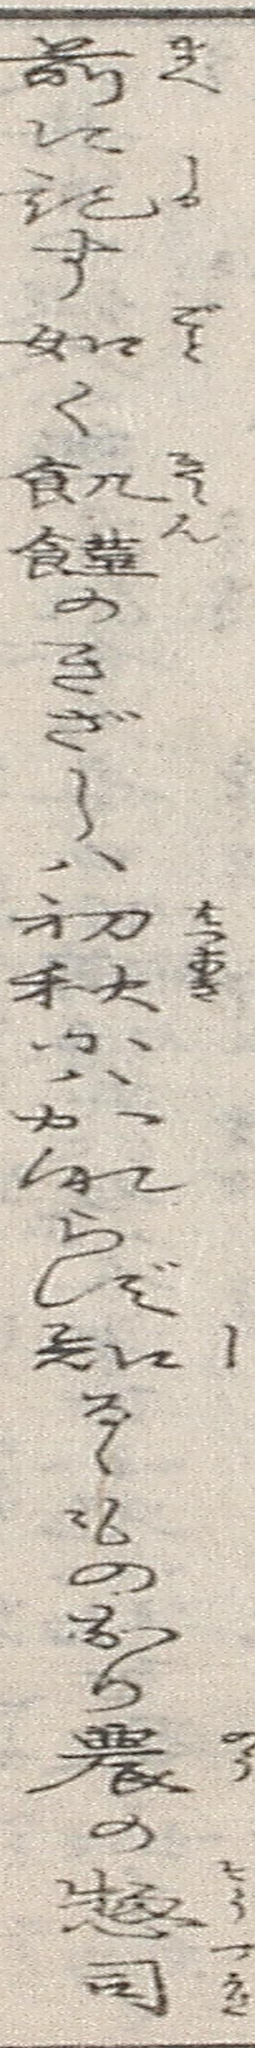前に記す如く飢饉のきざしは初秋にはかならず知るゝものなり農の惣司
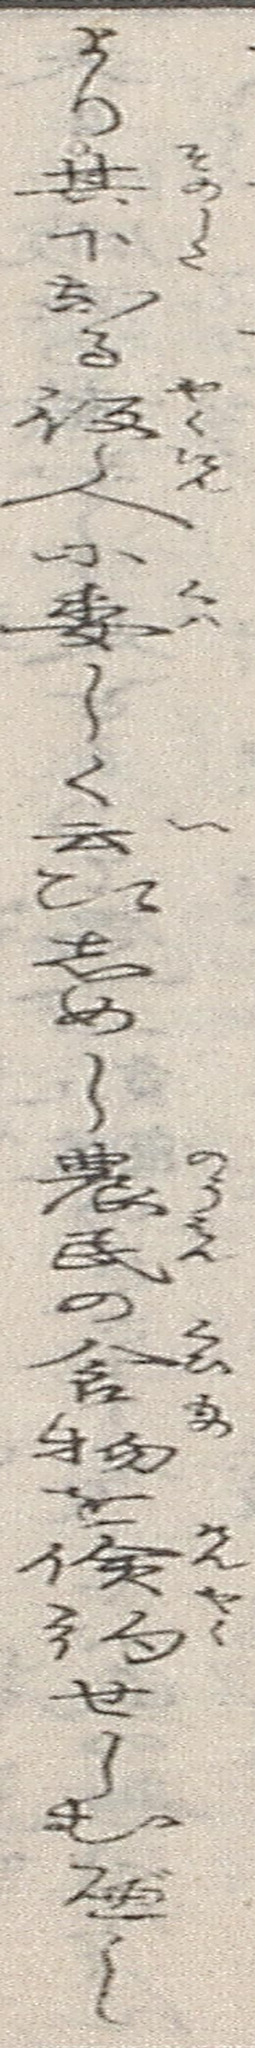より其下なる役人に委しく云ひしめし農民の食物を倹約せしむべし
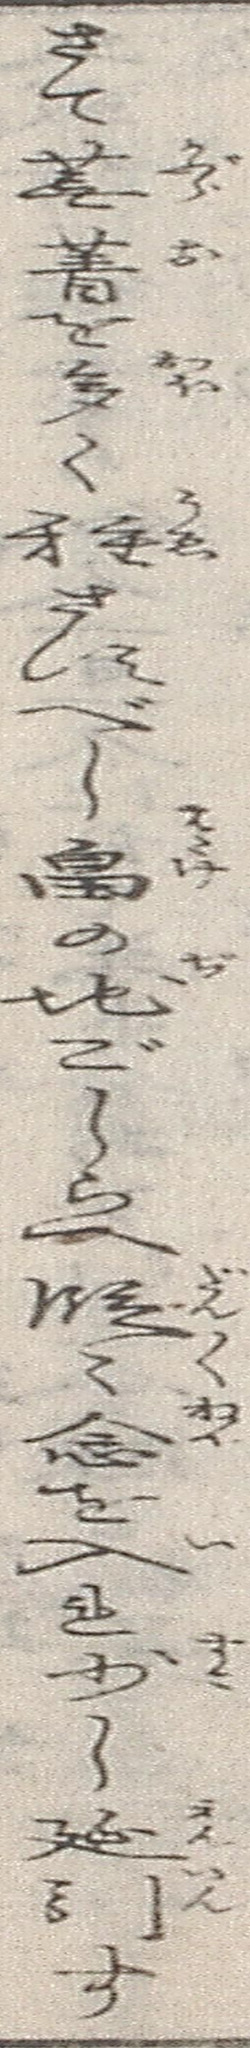さて蕪菁を多く種さすべし畠の地ごしらへ段〻念を入れ少し延引す
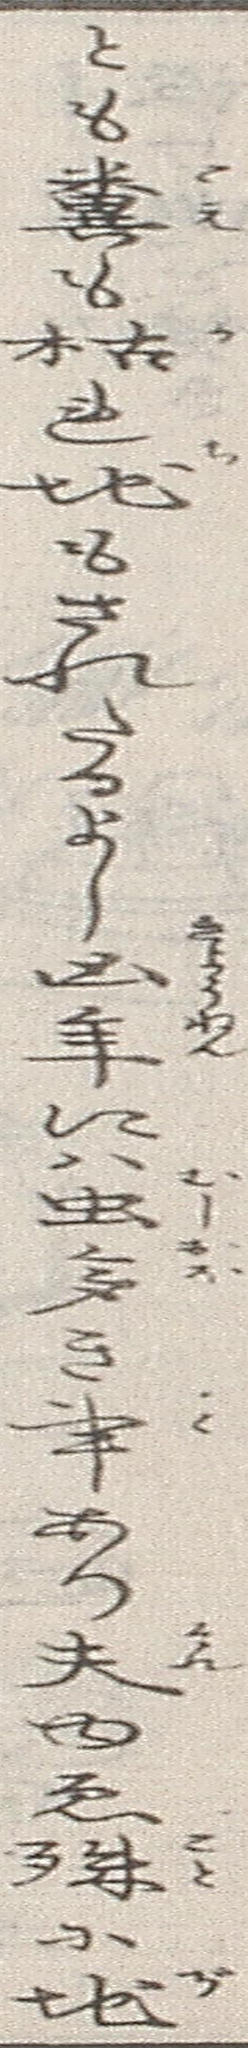とも糞も枯れ地もされたるよし凶年には虫多き事あり夫ゆゑ殊に地
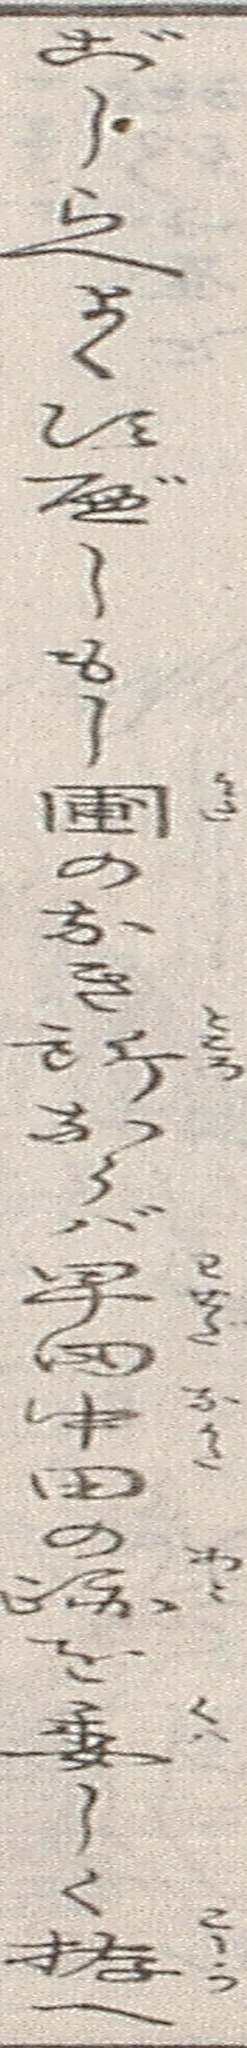ごしらへよくすべしもし圃のなき所ならば早田中田の跡を委しく拵へ
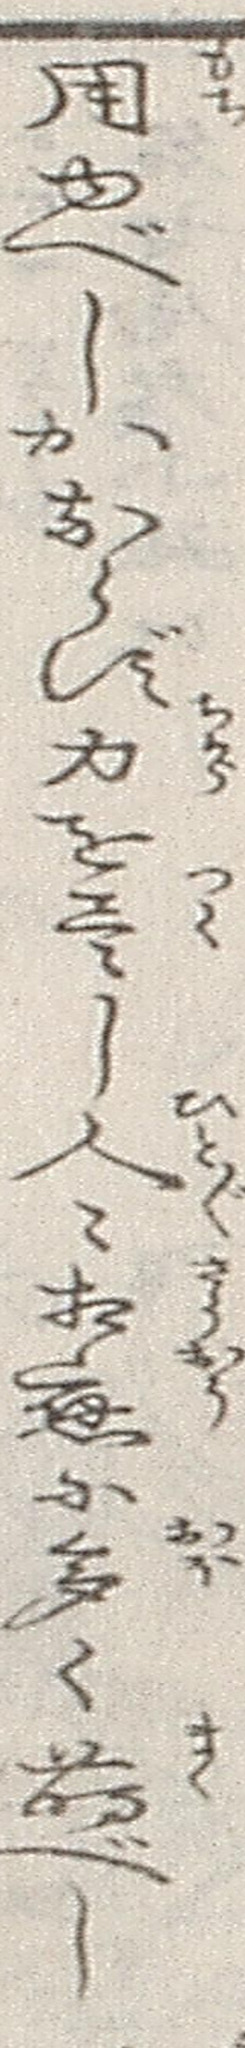用ゆべしかならず力を尽し人〻相応に多く蒔べし
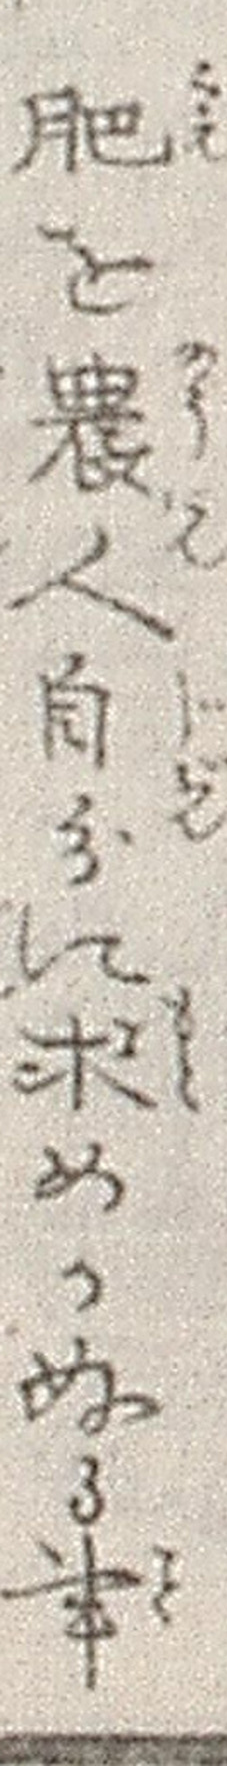肥を農人自分に求めかぬる事
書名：凶荒図録　完
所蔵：東京大学地震研究所図書室 Earthquake Research Institute Library, The University of Tokyo, JAPAN
